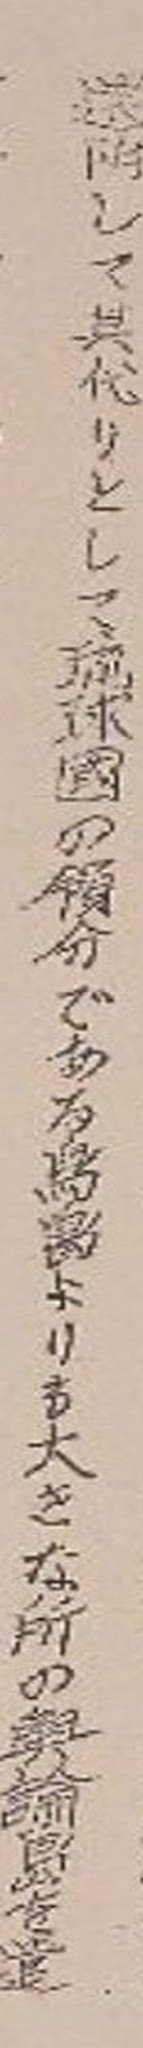還附して其代りとして琉球国の領分である鳥島よりも大きな所の与論島を遣
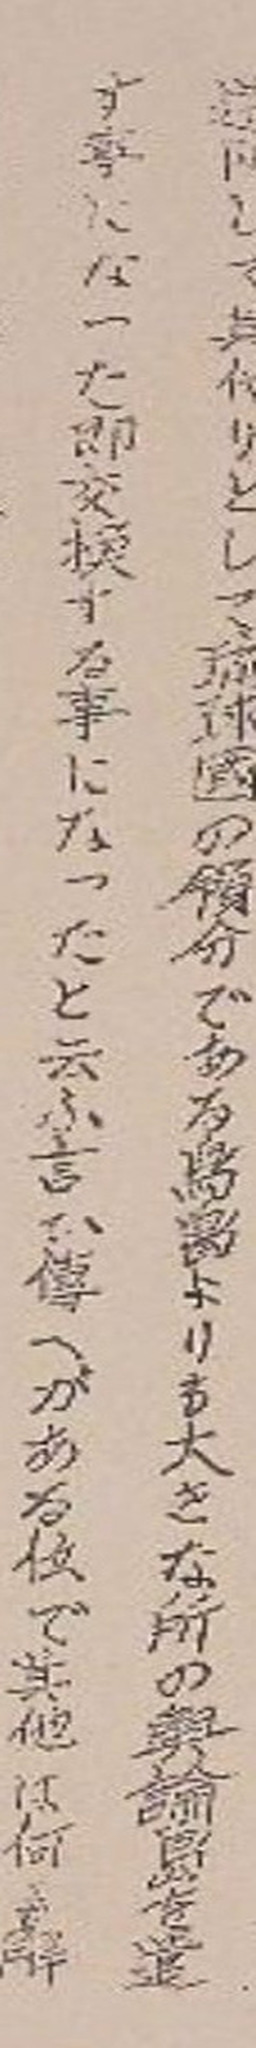す事になつた即交換する事になつたと云ふ言い伝へがある位で其他は何も解
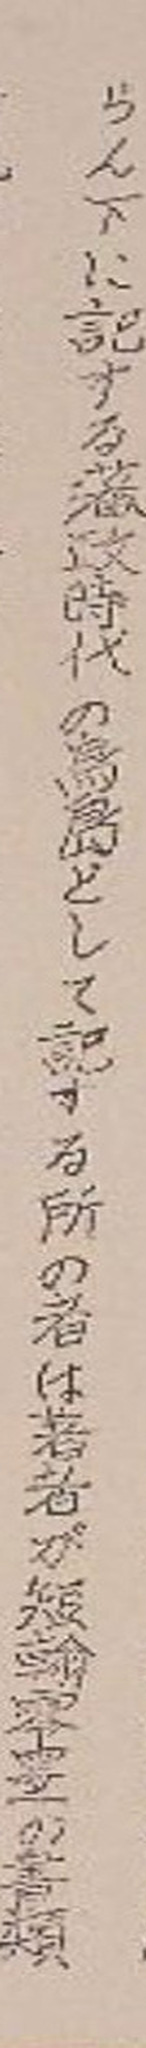らん下に記する藩政時代の鳥島として記する所の者は著者が短翰零墨の書類
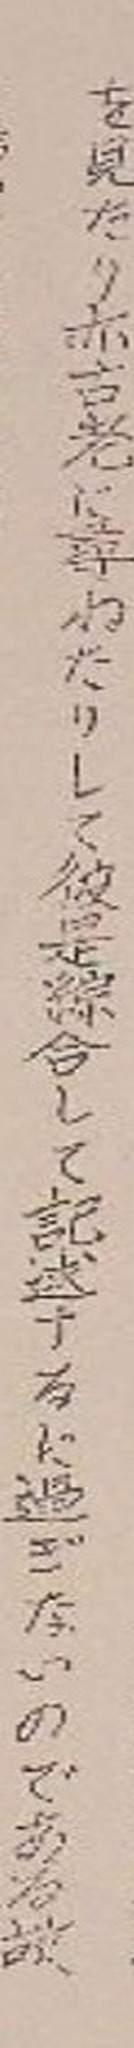を見たり亦古老に尋ねたりして彼是総合して記述するに過ぎないのである故
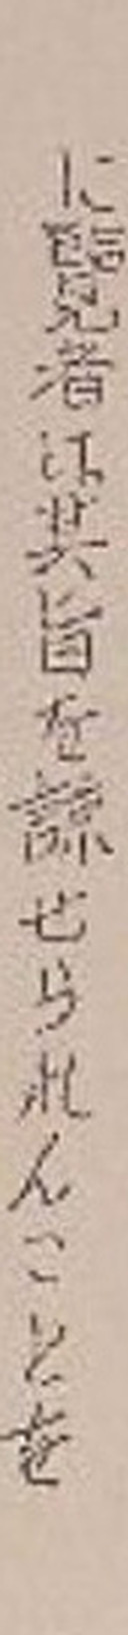に覧者は其旨を諒せられんことを
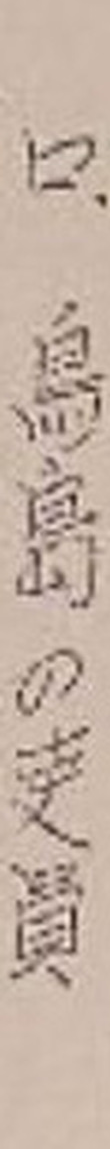ロ鳥島の吏員
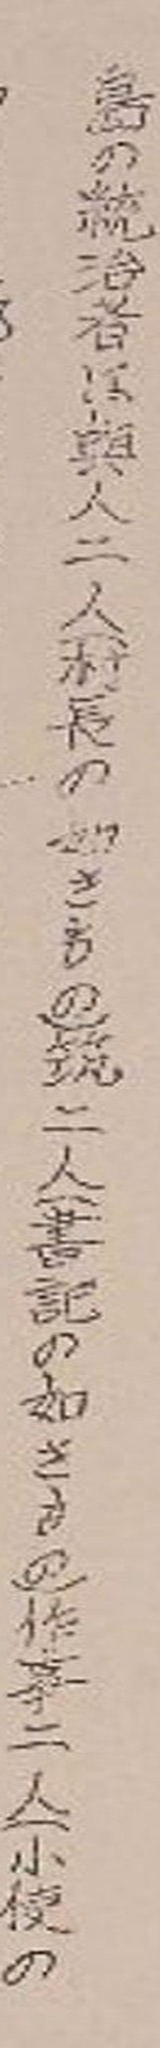島の統治者は与人二人(村長の如きもの)筑二人(書記の如きもの)作事二人(小使の
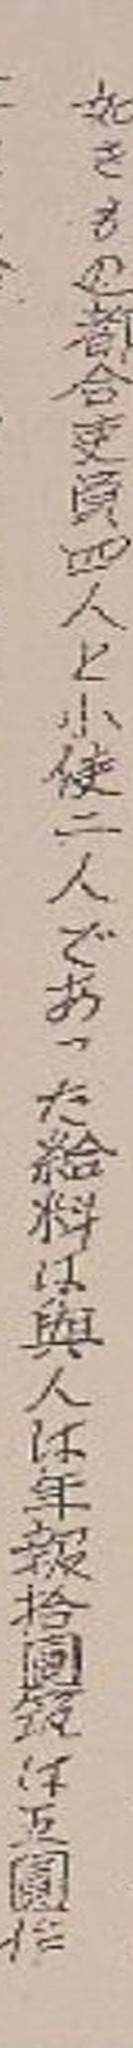如きもの)都合吏員四人と小使二人であった給料は与人は年報拾円筑は五円作
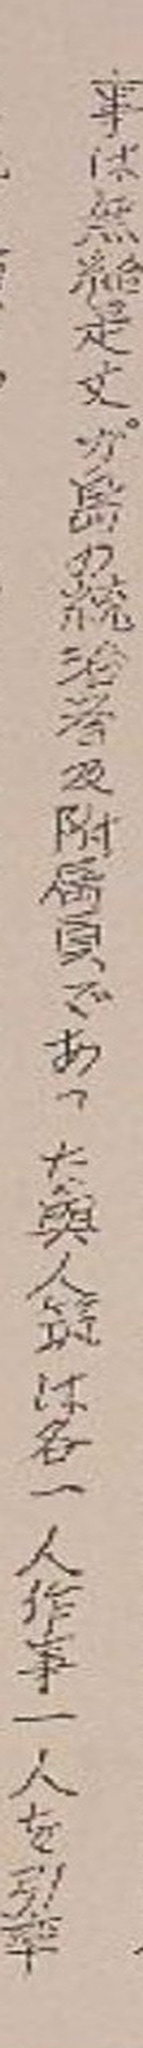事は無給是丈が島の統治者及附属員であった与人筑は各一人作事一人を引率
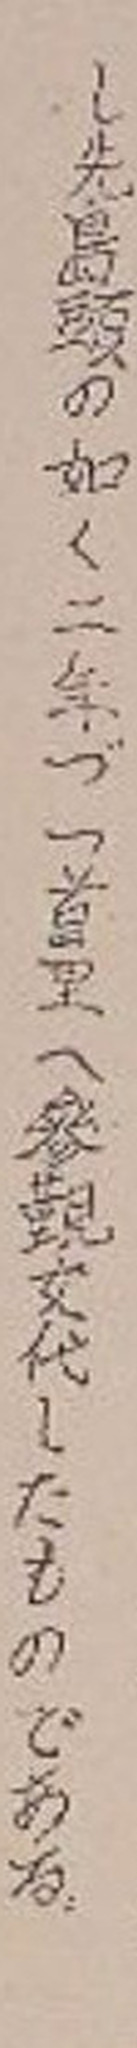し先島頭の如く二年づつ首里へ参覲交代したものである。
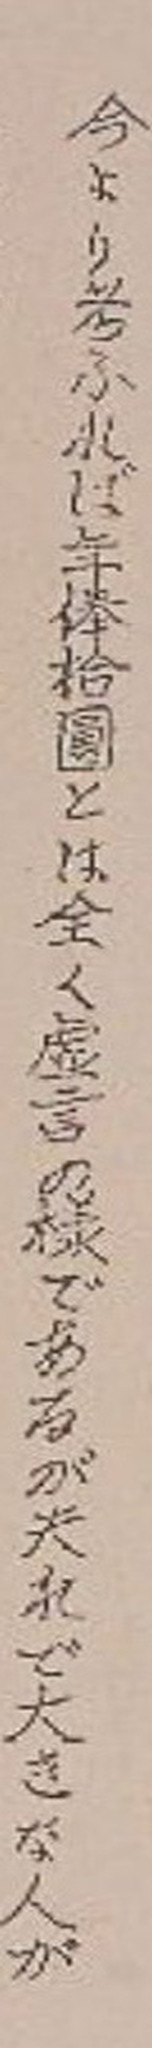今より考ふれば年俸拾円とは全く虚言の様であるが夫れで大きな人が
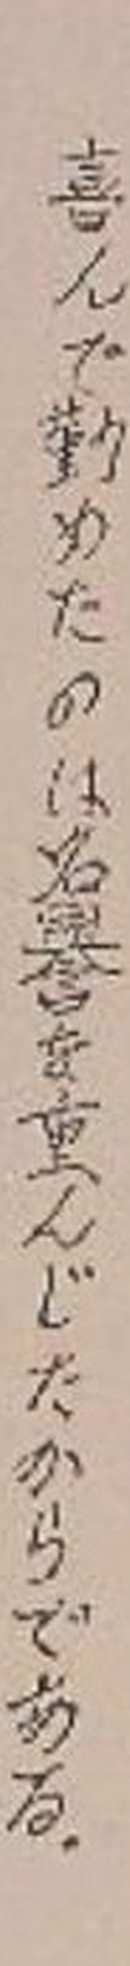喜んで勤めたのは名誉を重んじたからである。

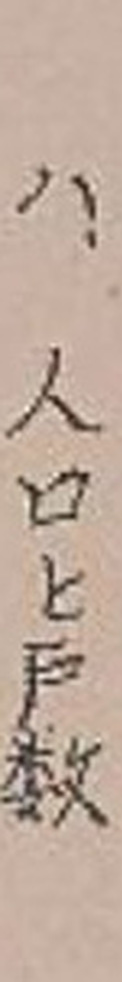ハ．人口と戸数
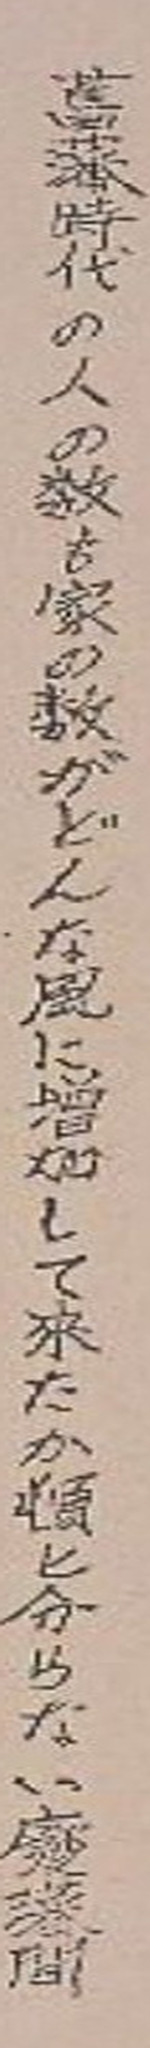旧藩時代の人の数も家の数がどんな風に増加して来たか頓と分らない廃藩間
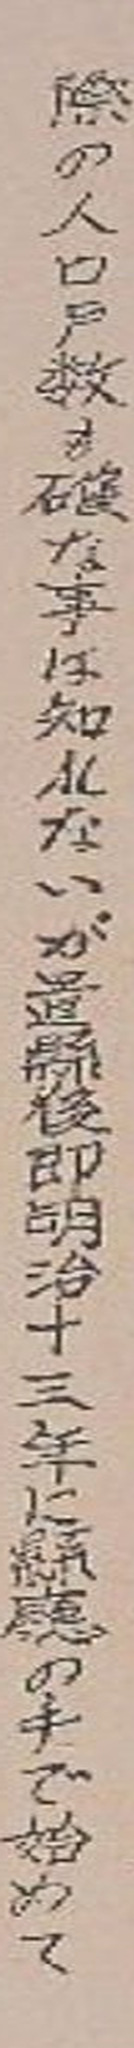際の人口戸数も確な事は知れないが置県後即明治十三年に県庁の手で始めて
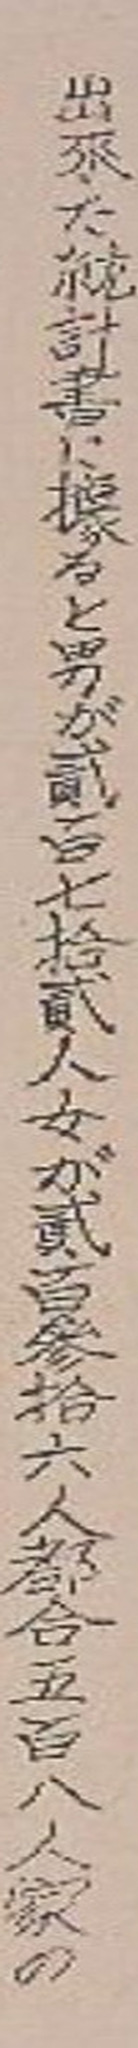出来た統計書に拠ると男が弐百七拾弐人女が弐百参拾六人都合五百八人家の
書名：鳥島移住始末
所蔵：University of the Ryukyus Library
